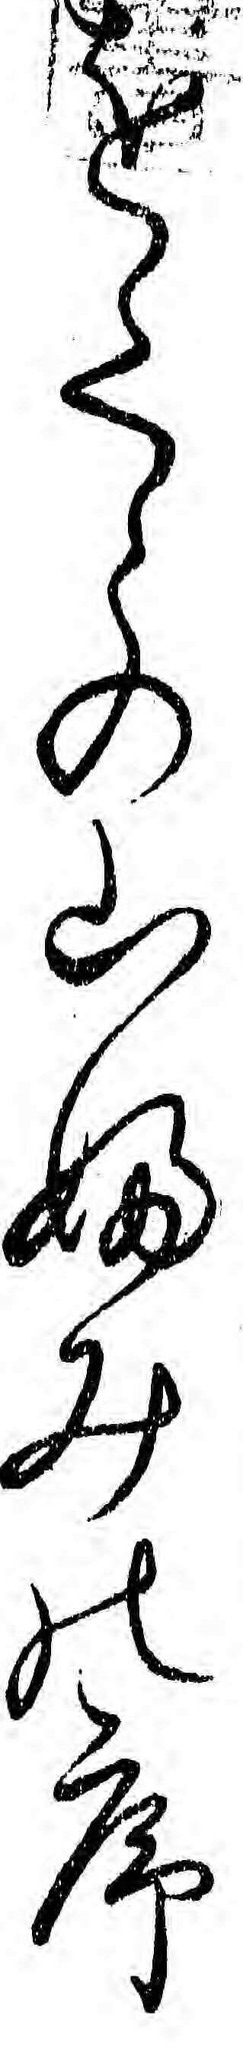をくらの山ふみの序
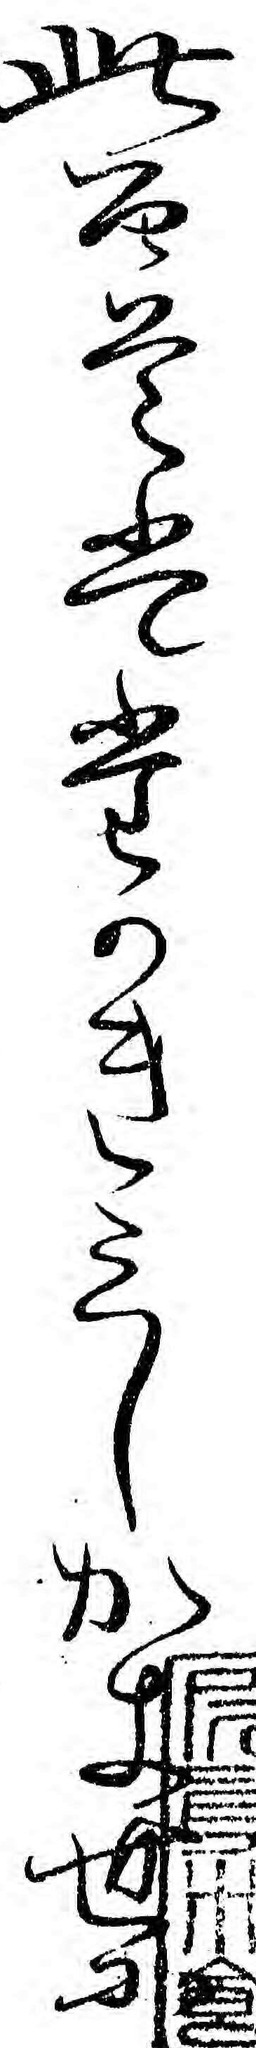此百首はたかきみしかき世に
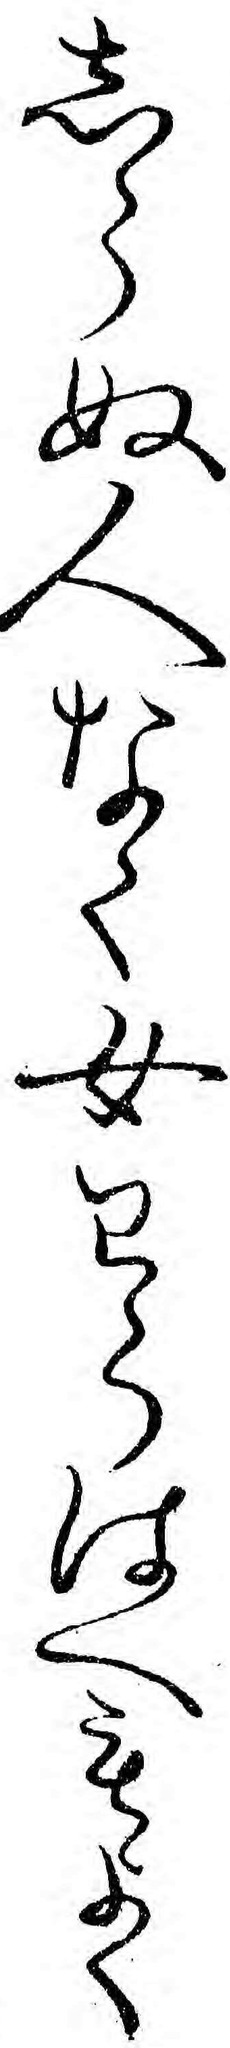しらぬ人なく女わらはへもよく
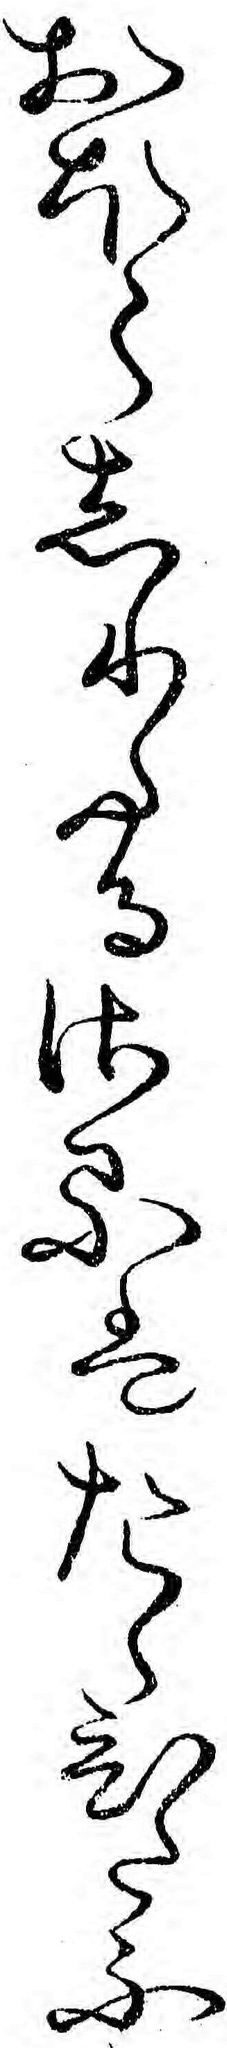おほくしりたるさるはたゝひたふ
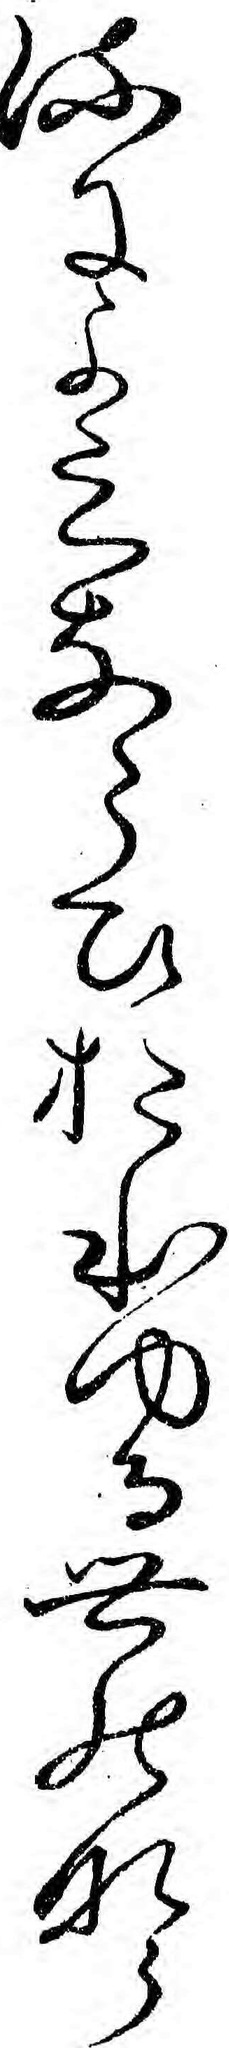るによみならひおほゆる世のなら
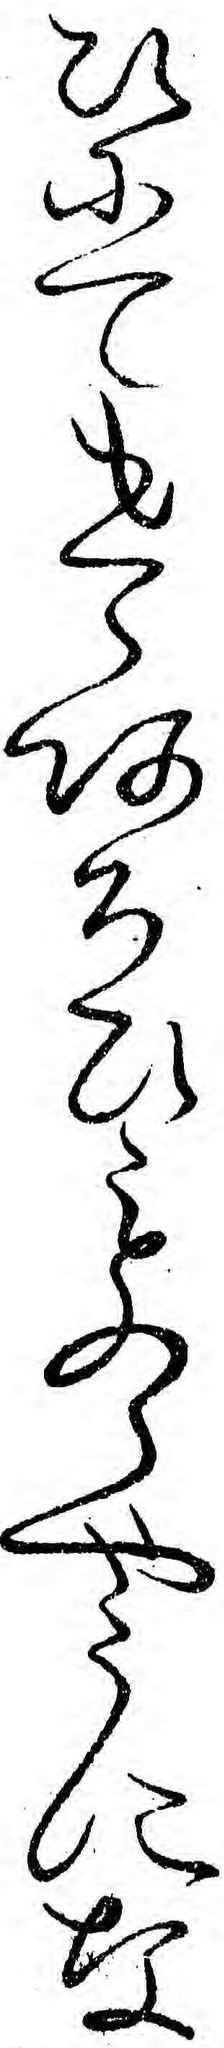ひにてもてあそひものゝやうにな
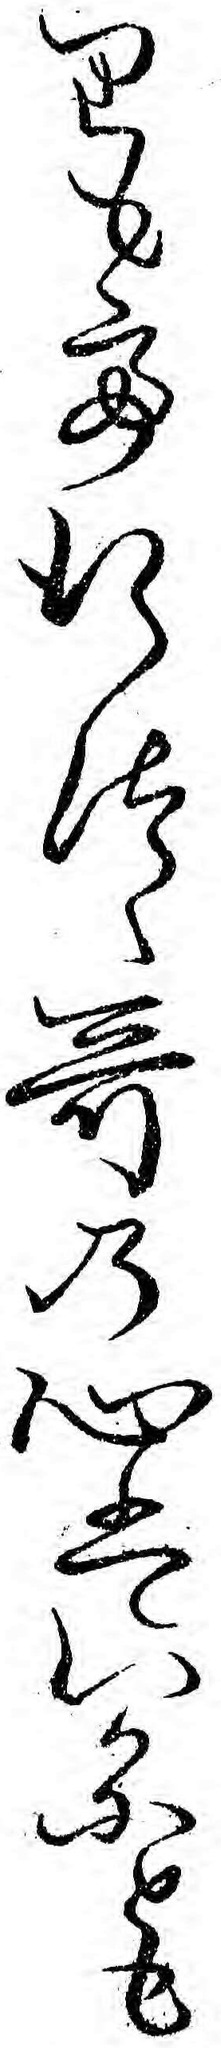りもて行つゝ哥の心はいかにとも
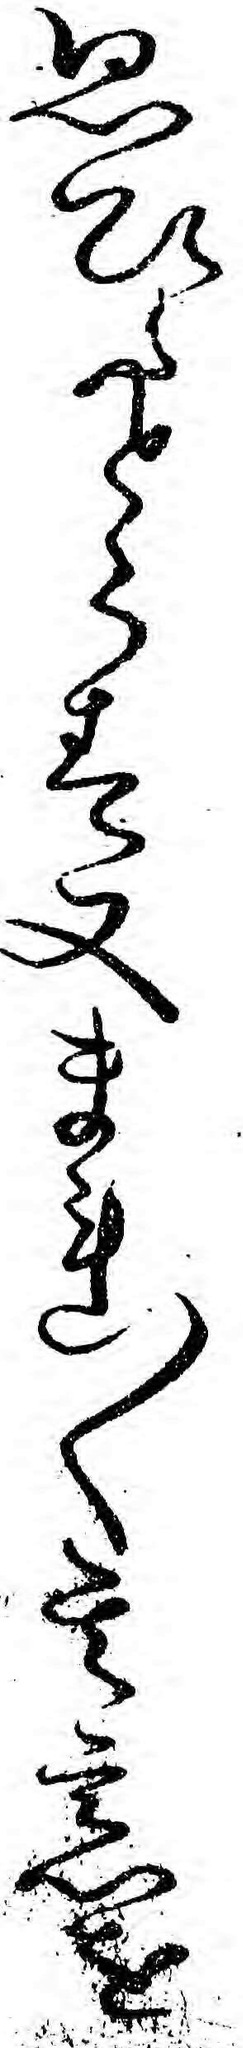思ひたとらす又まれ〳〵其意を

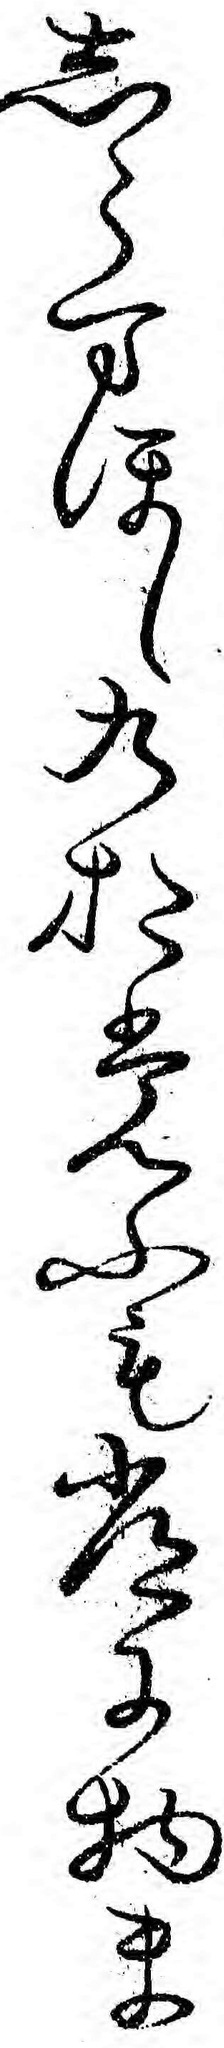しらまほしくおもふも常に物ま
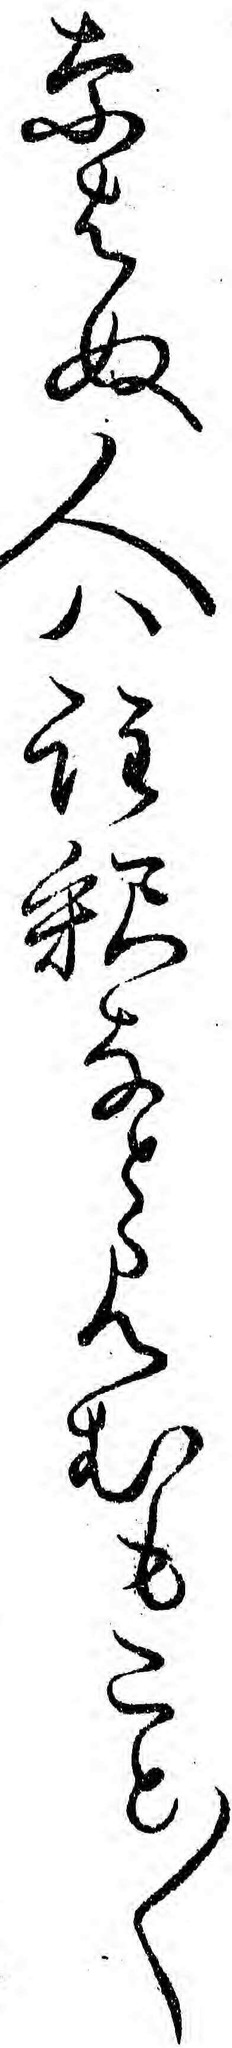なはぬ人は註釈なと見むもこと〳〵
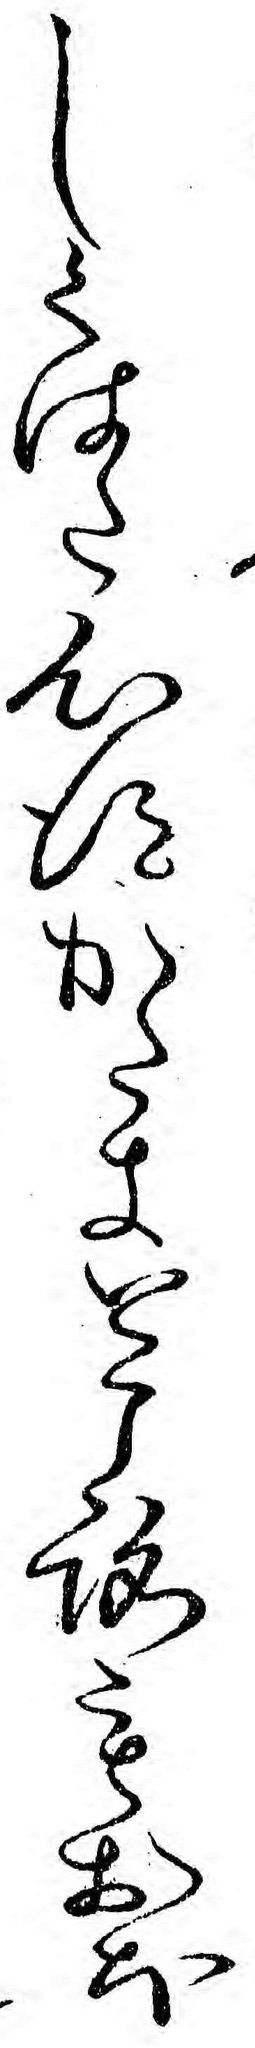しくはた心得かたきところもおほ
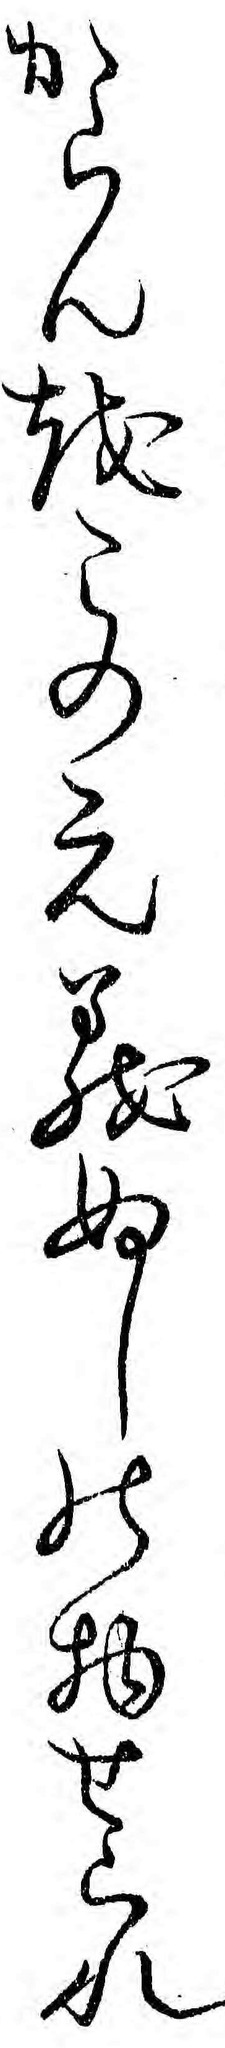からんをこの元義ぬしの物せられ
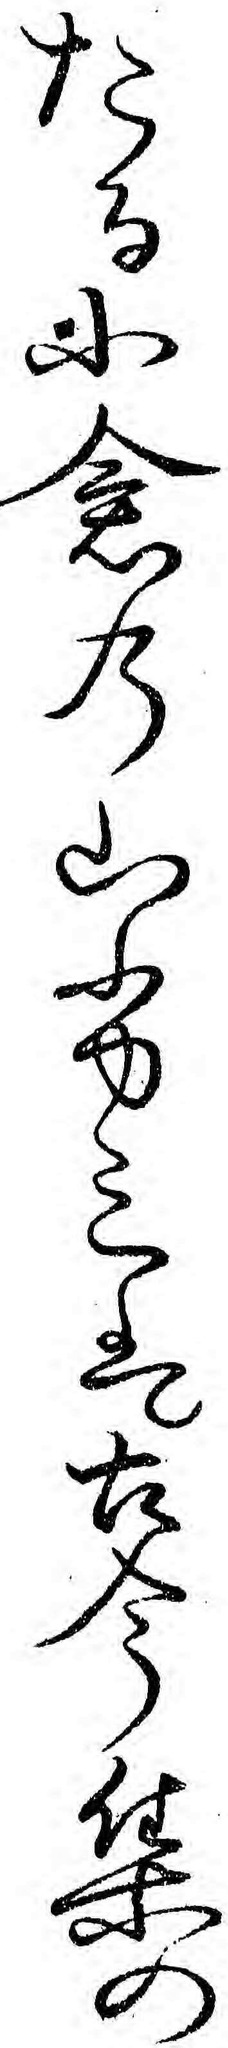たる小倉の山ふみは古今集の
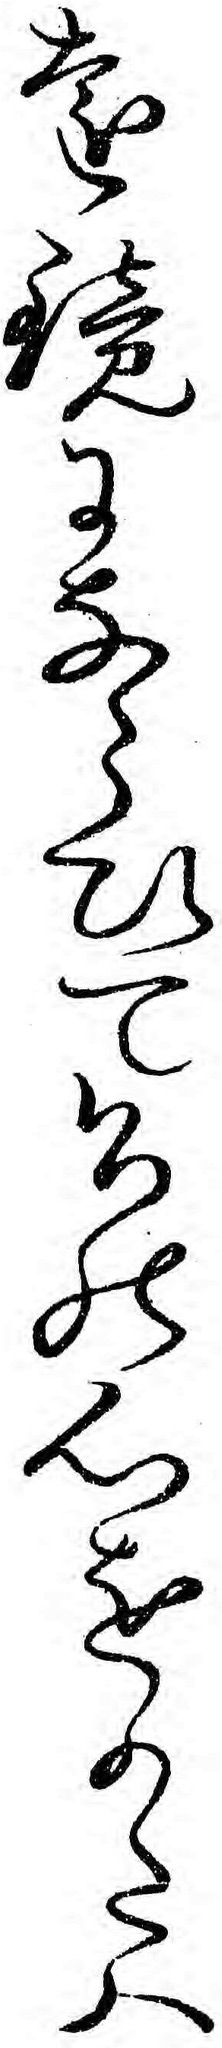遠鏡にならひてその心をかたは
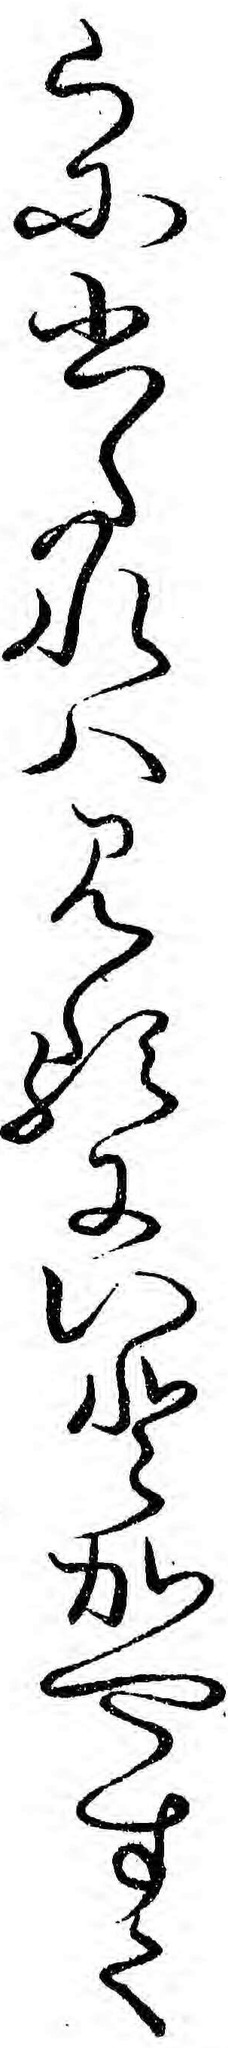らに書たれは見るにいとかやすく
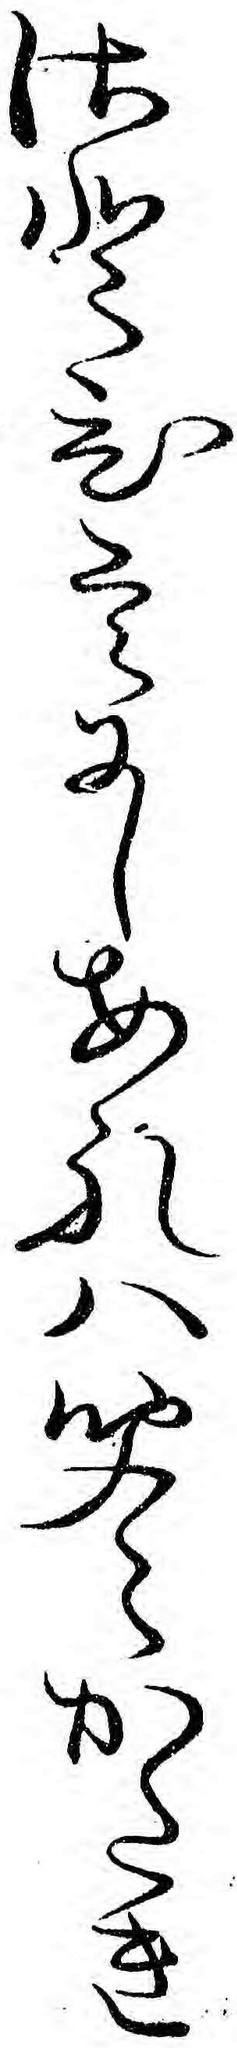さとひ言にしあれは聞々かたき
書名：百人一首／小倉の山ふみ
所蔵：国文学研究資料館
